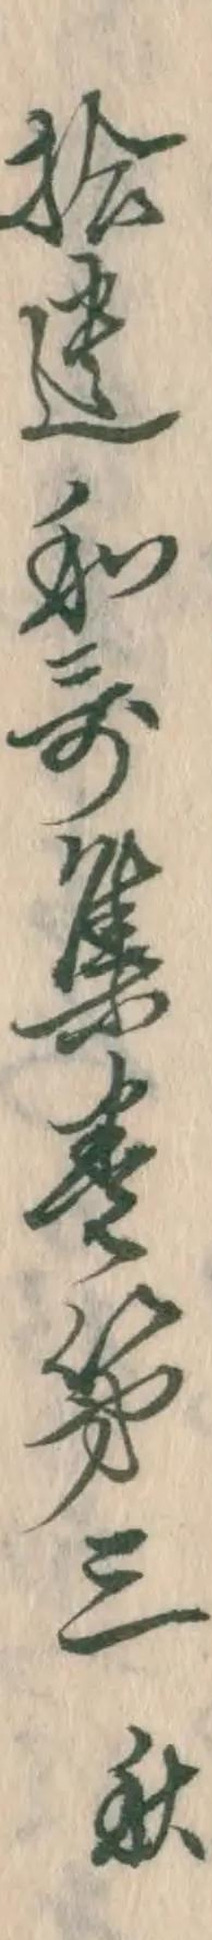拾遺和哥集巻第三秋
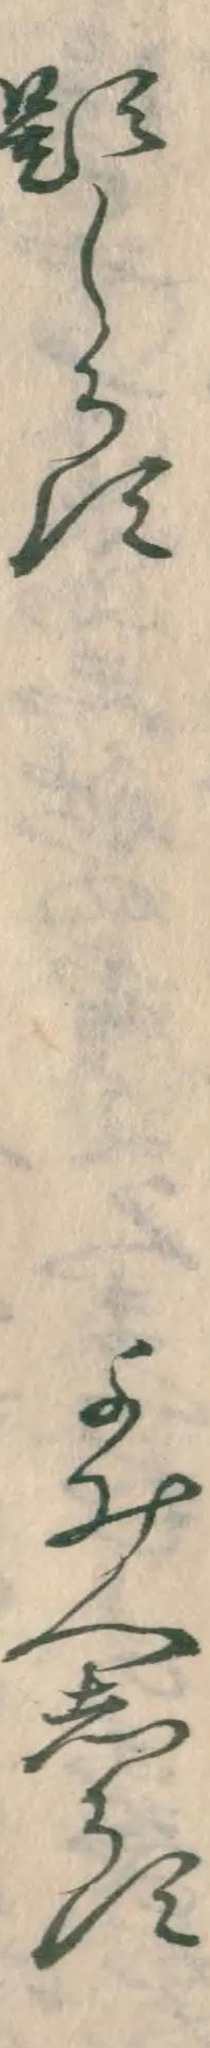題しらすよみ人しらす
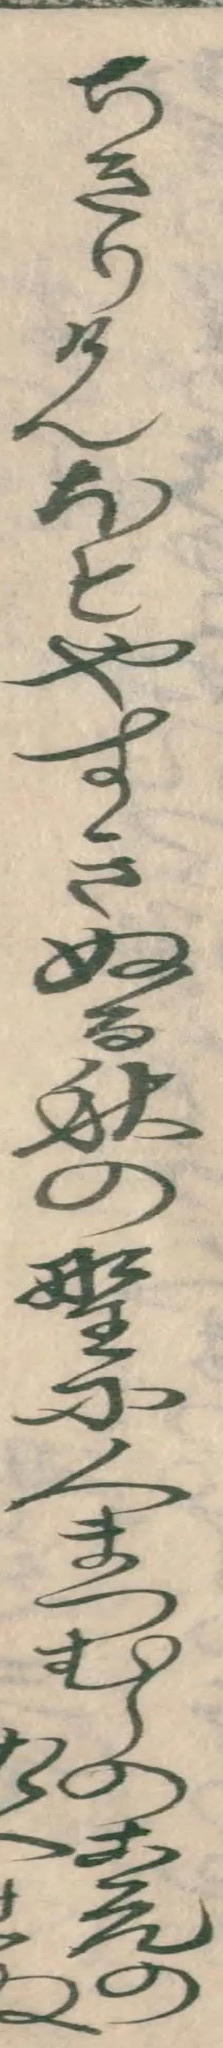ちきりけんほとやすきぬる秋の野に人まつむしのこえの
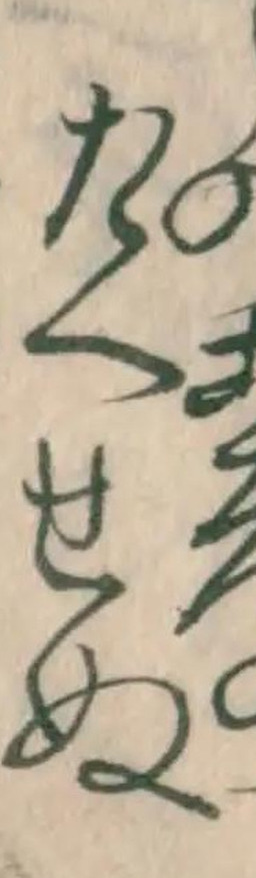たへせぬ
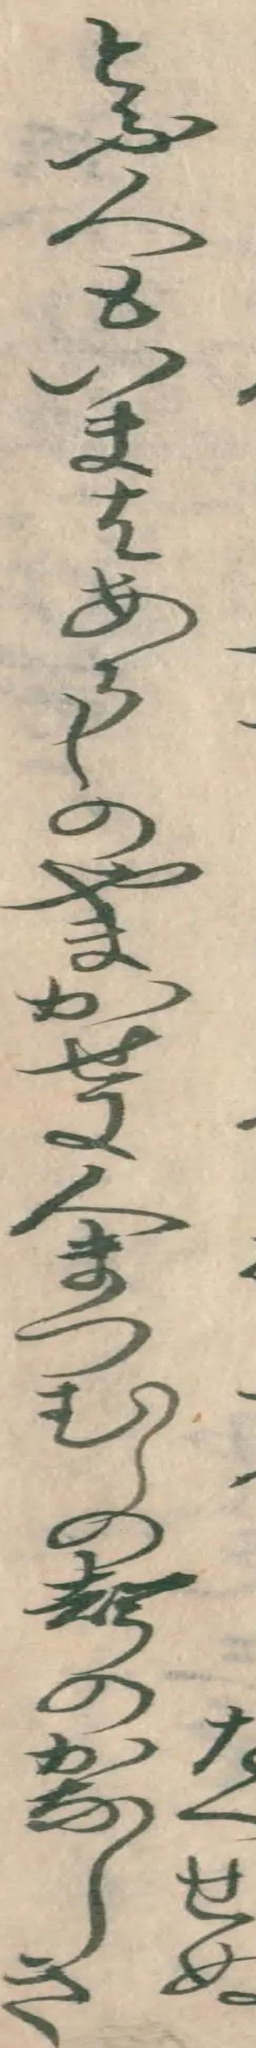とふ人もいまはあらしのやまかせに人まつむしの聲のかなしき

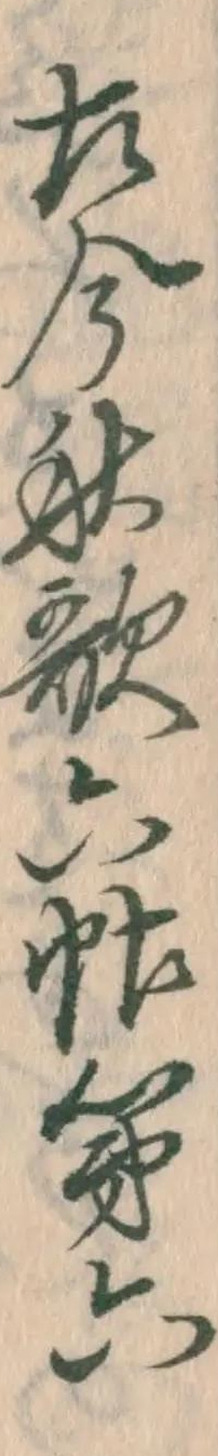古今秋歌六帖第六
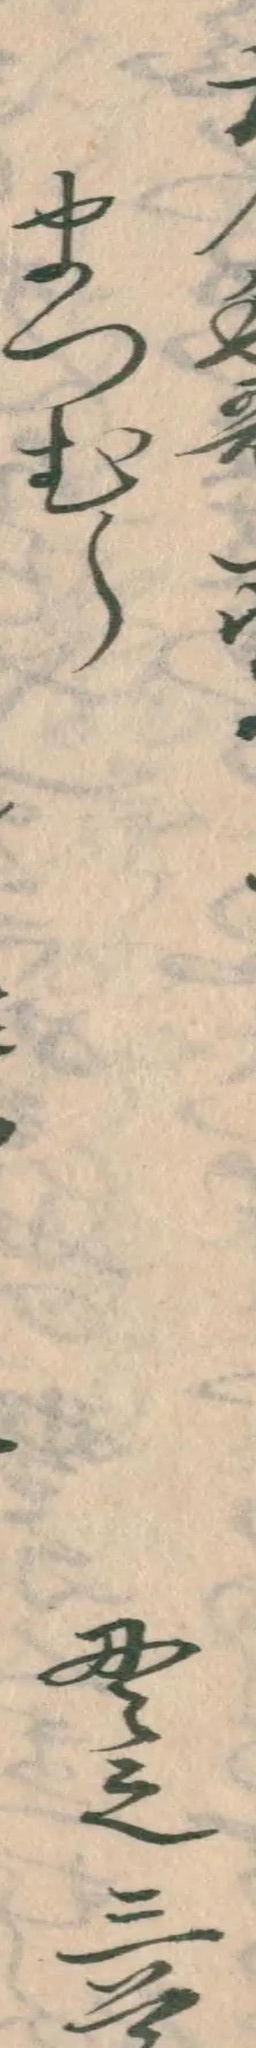まつむし貫之三首
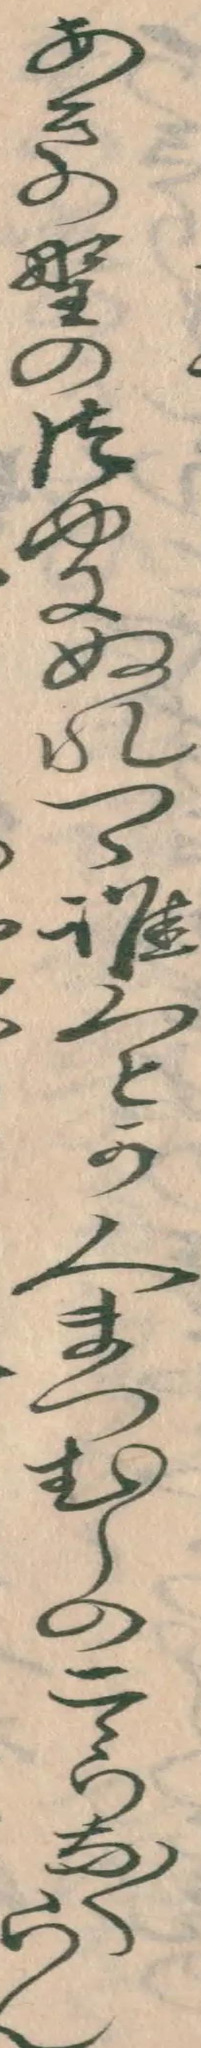あきの野のつゆにぬれつゝ誰くとか人まつむしのこゝらなくらん
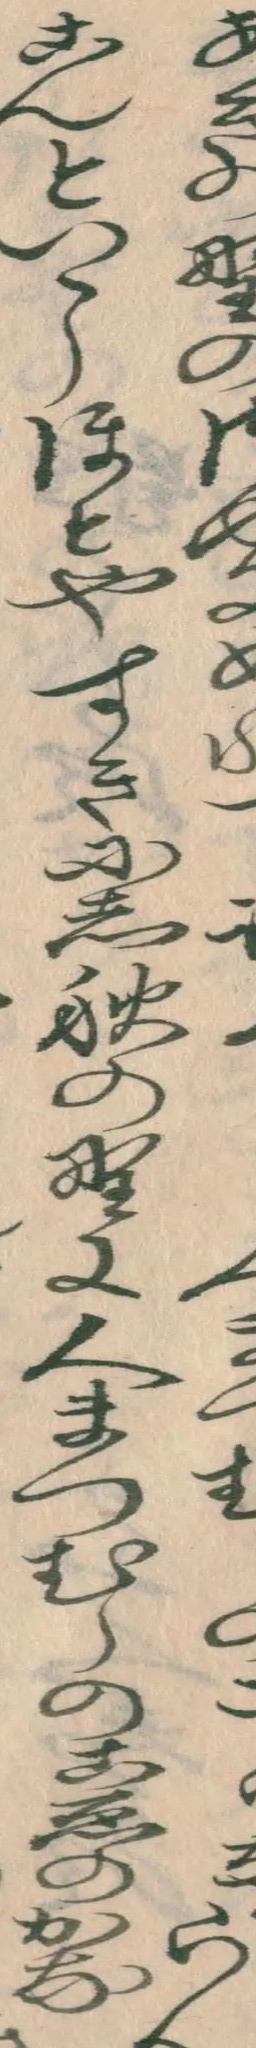こんといゝしほとやすきにし秋の野に人まつむしのこゑのかな
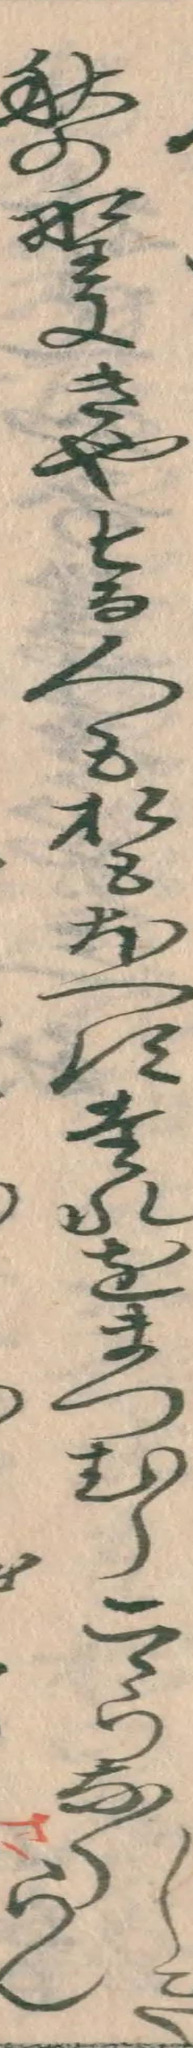秋の野にきやとる人もおもほへすたれをまつむしここらなく
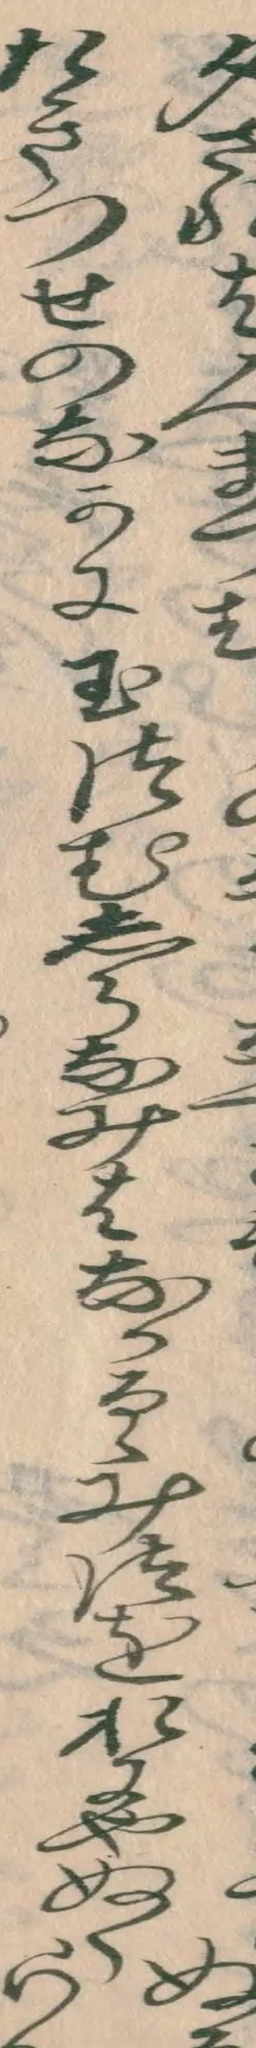たきつせのなかに玉つむしらなみはなかるゝみつをおにやぬく
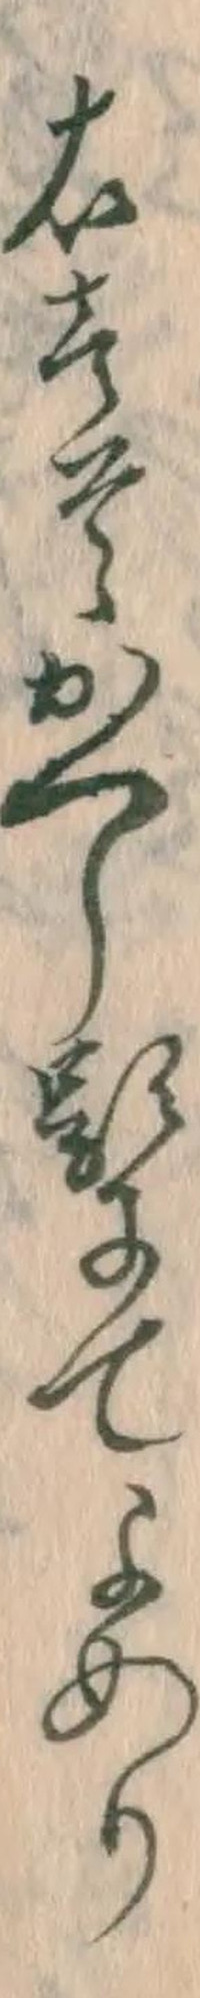右壱首かくし題にてよめり
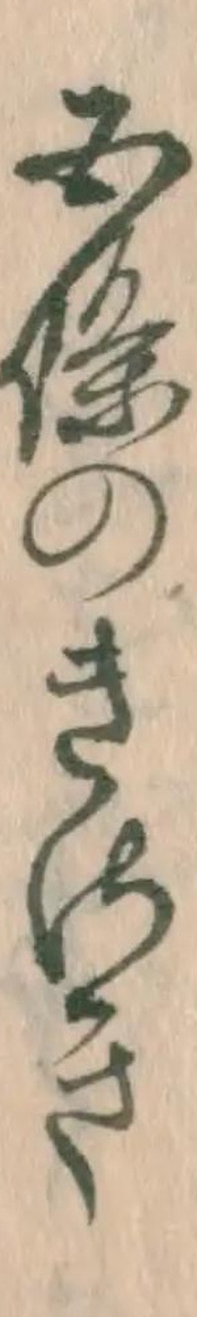五條のきさき
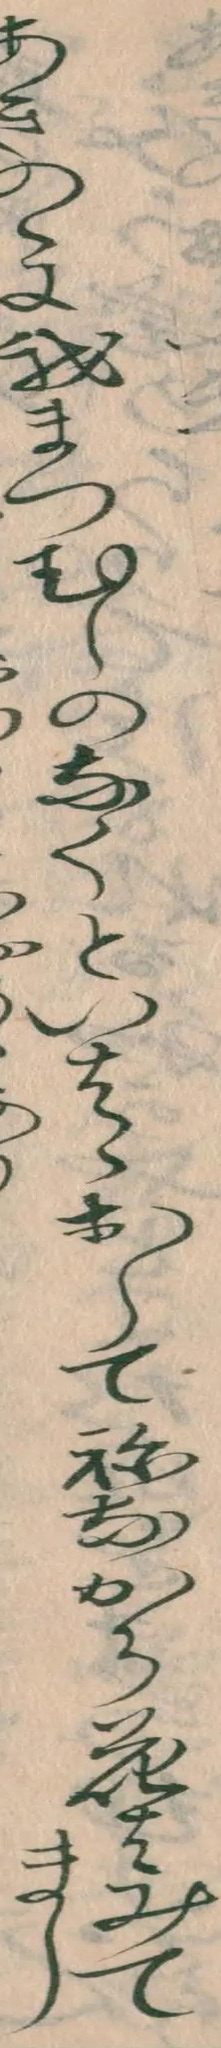あきのゝに我まつむしのなくといはゝおらてねなから花はみて
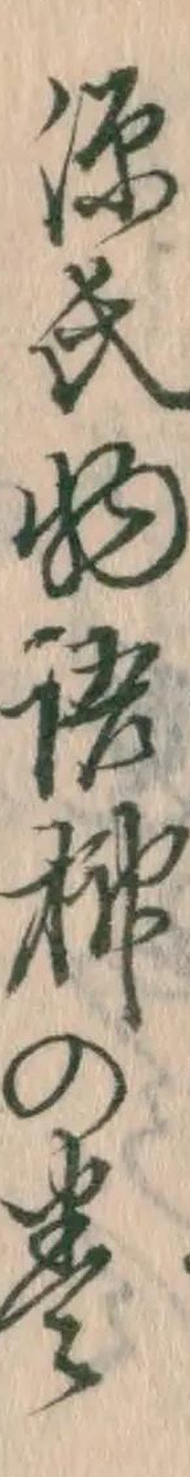源氏物語榊の巻
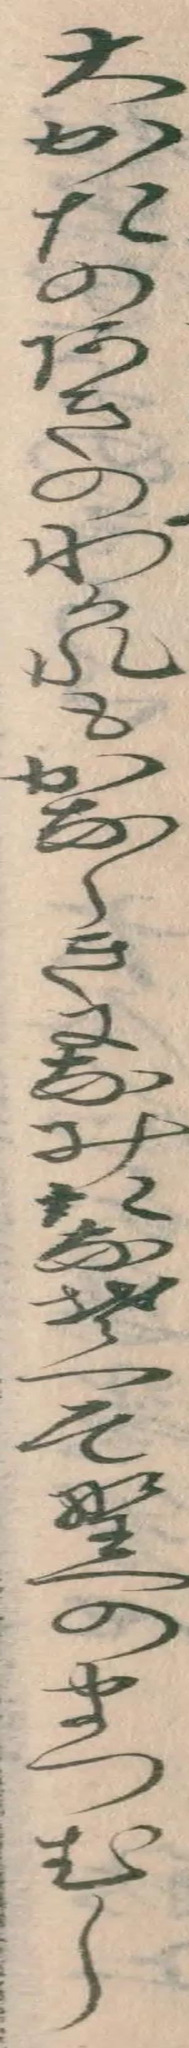大かたのあきのわかれもかなしきになみたなそへそ野へのまつむし
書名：千蟲譜 3巻. [3]
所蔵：国立国会図書館 National Diet Library, JAPAN
